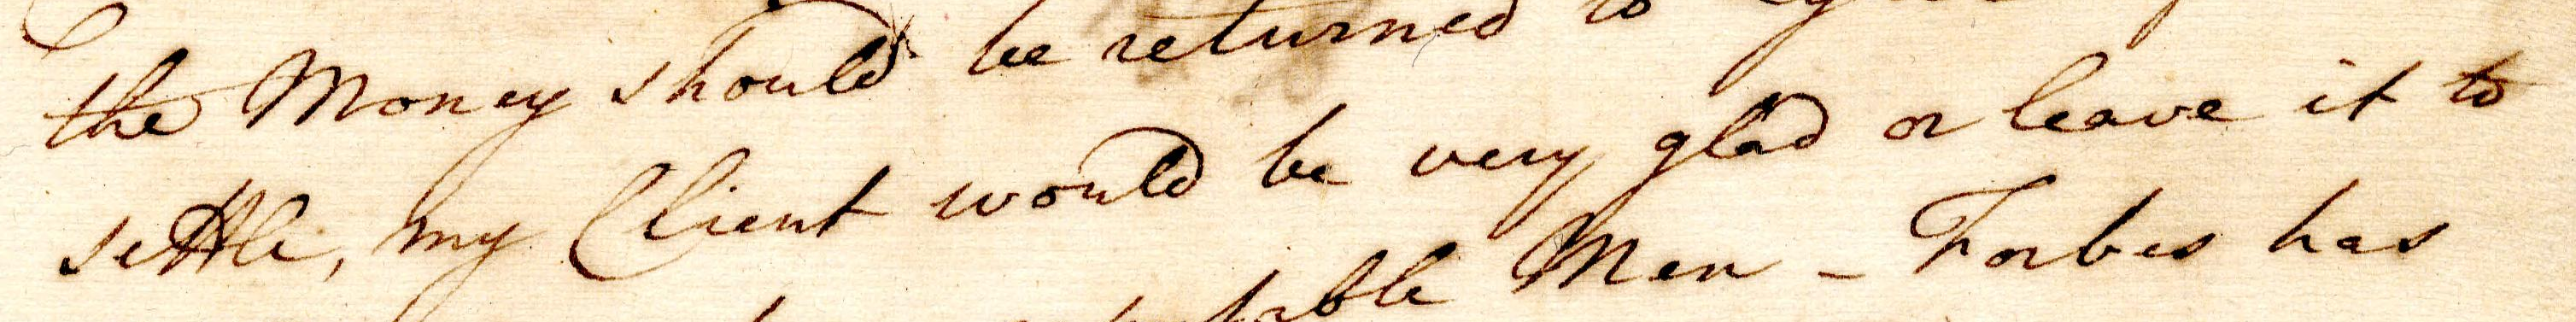settle, my Client would be very glad or leave it to
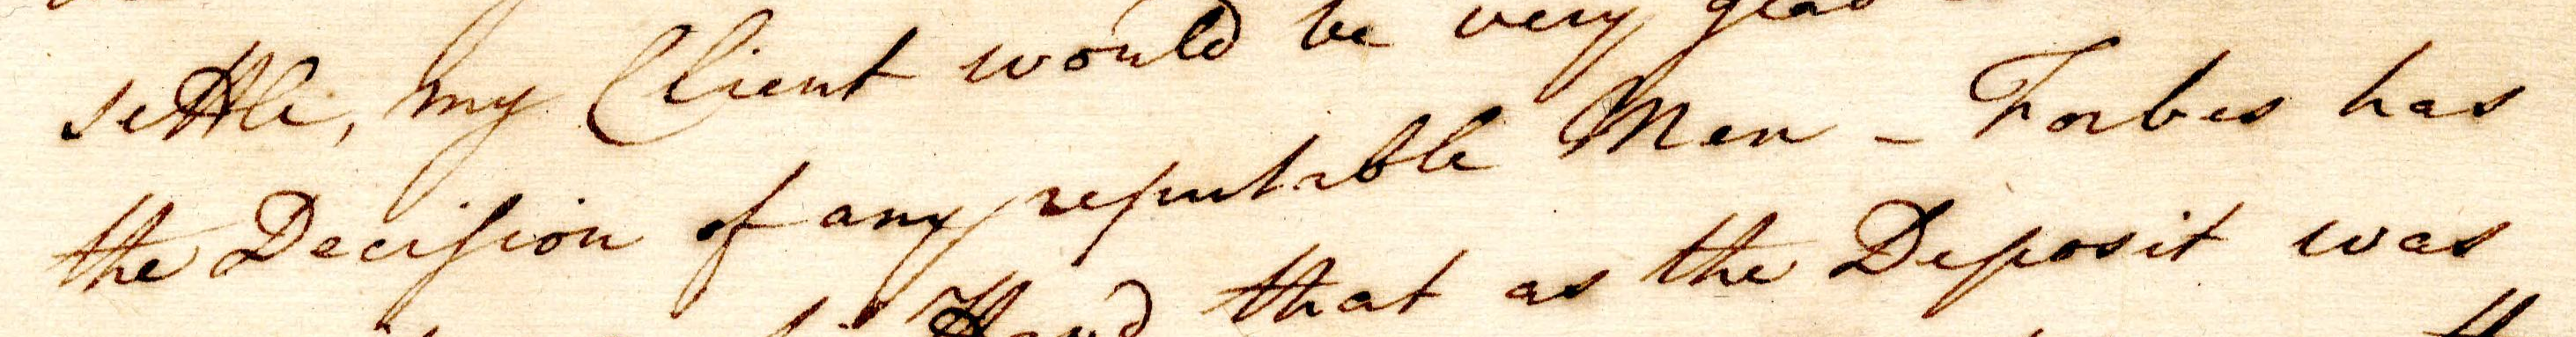the Decision of any reputable Men- Forbes has
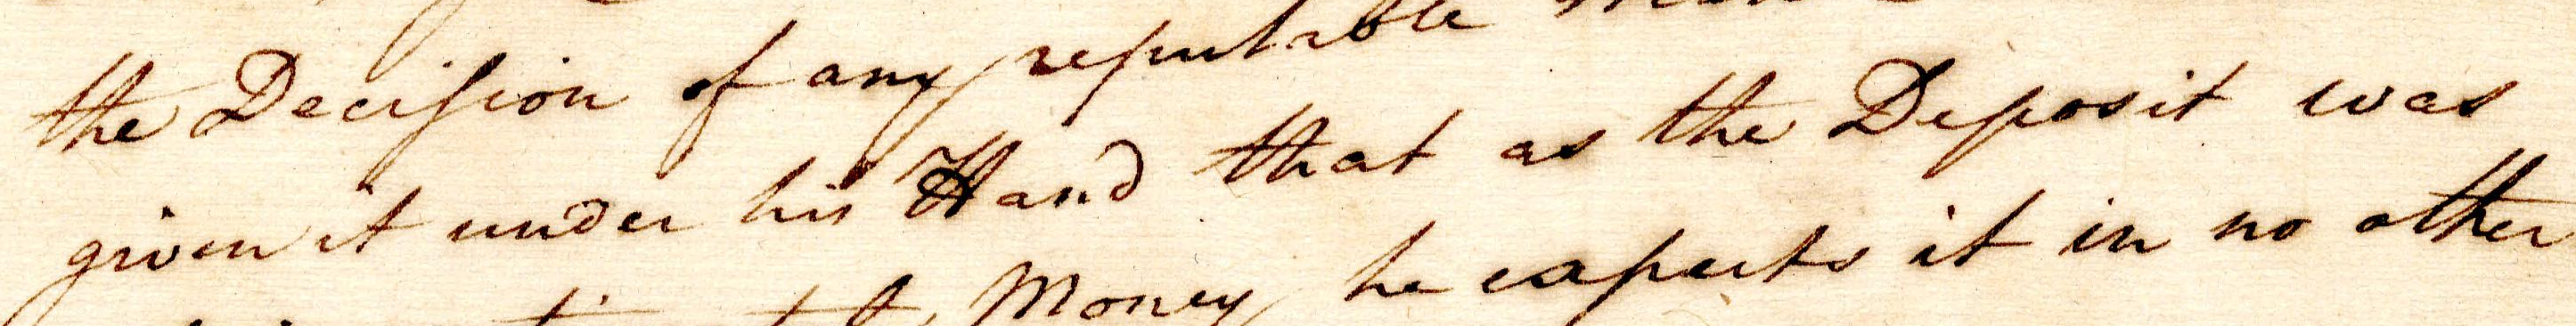given it under his Hand that as the Deposit was
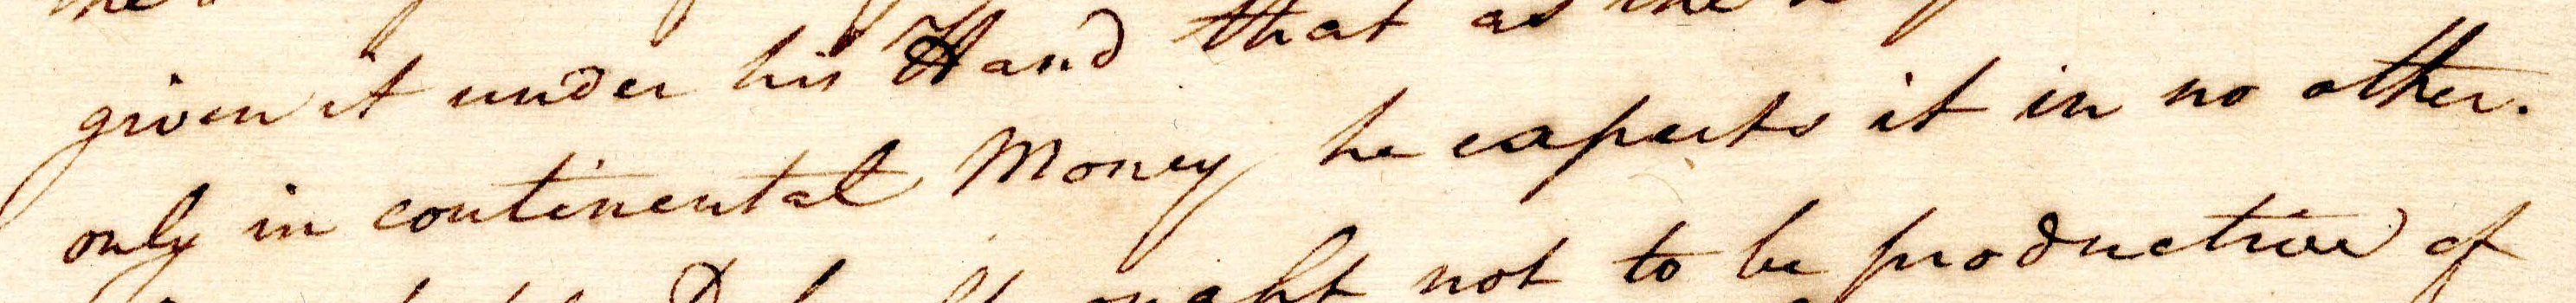only in continental Money he expects it in no other.
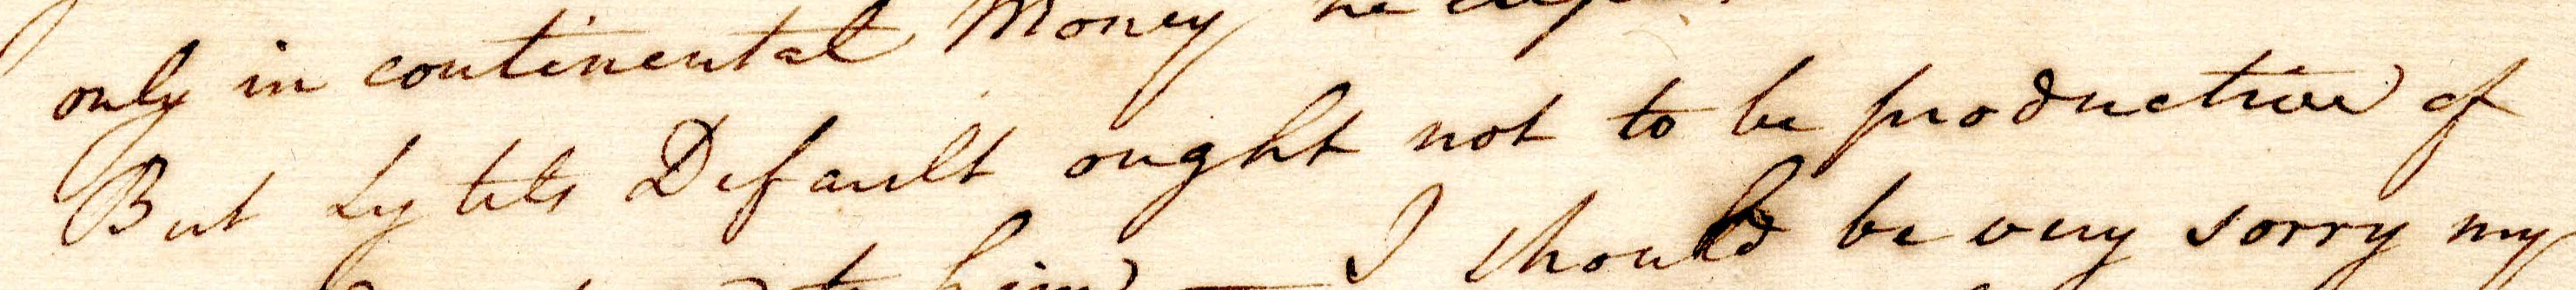But Lytels Default ought not to be productive of
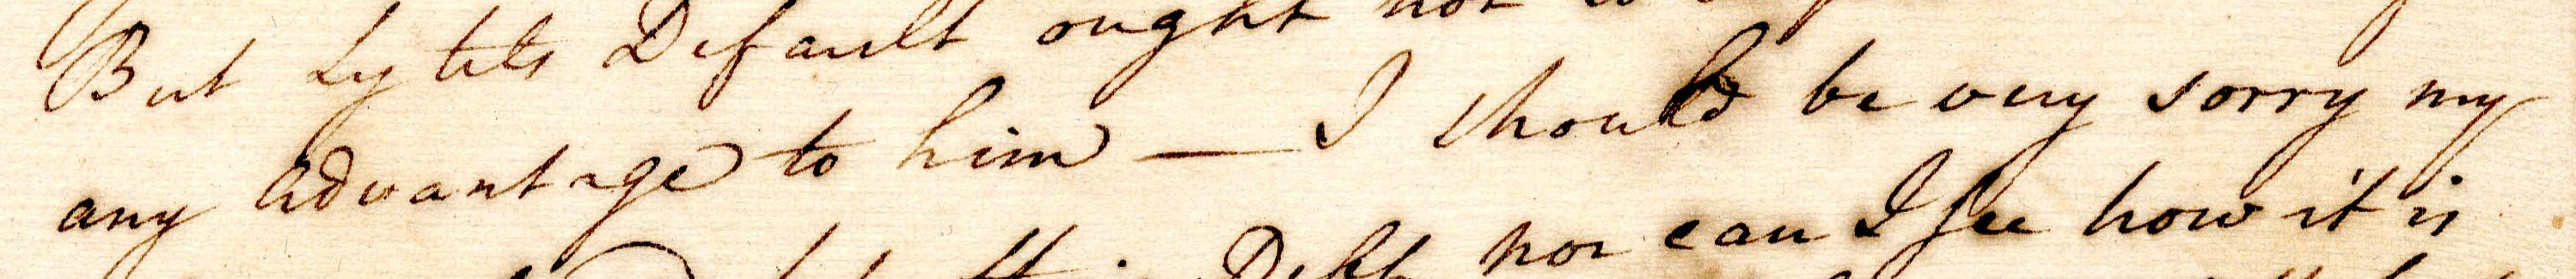any Advantage to him- I should be very sorry my
